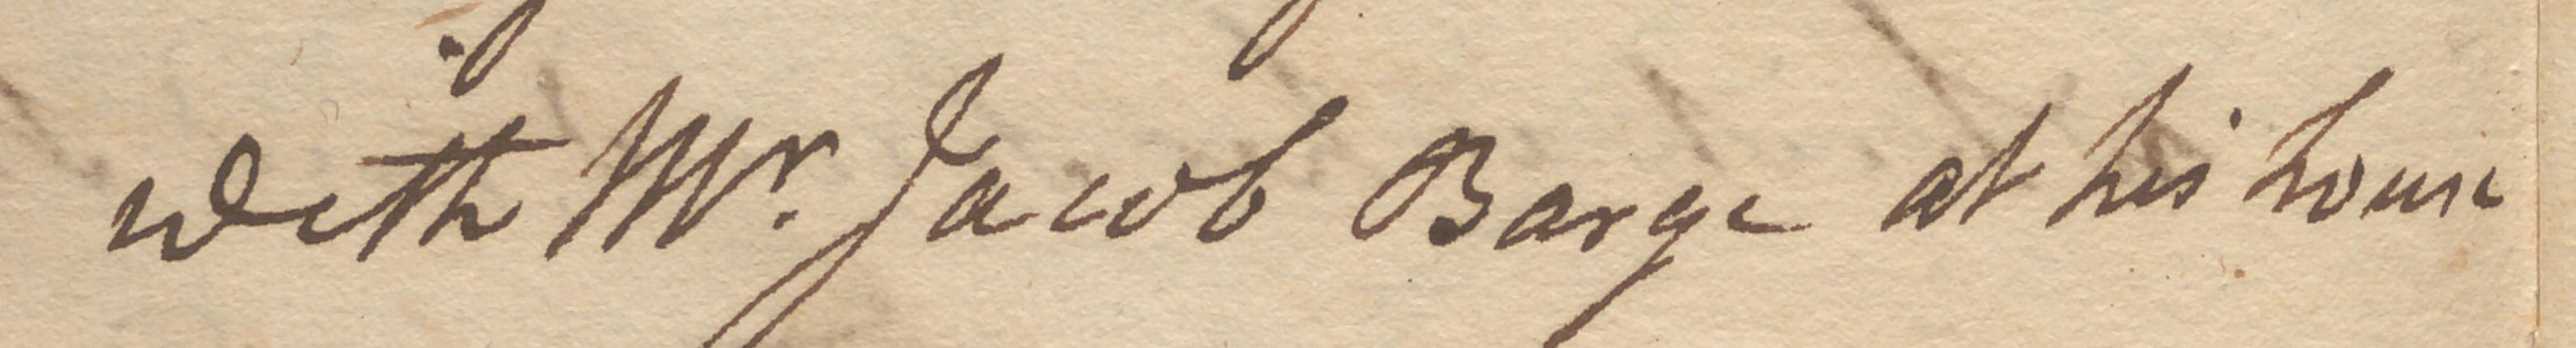with M^r. Jacob Barge at his house
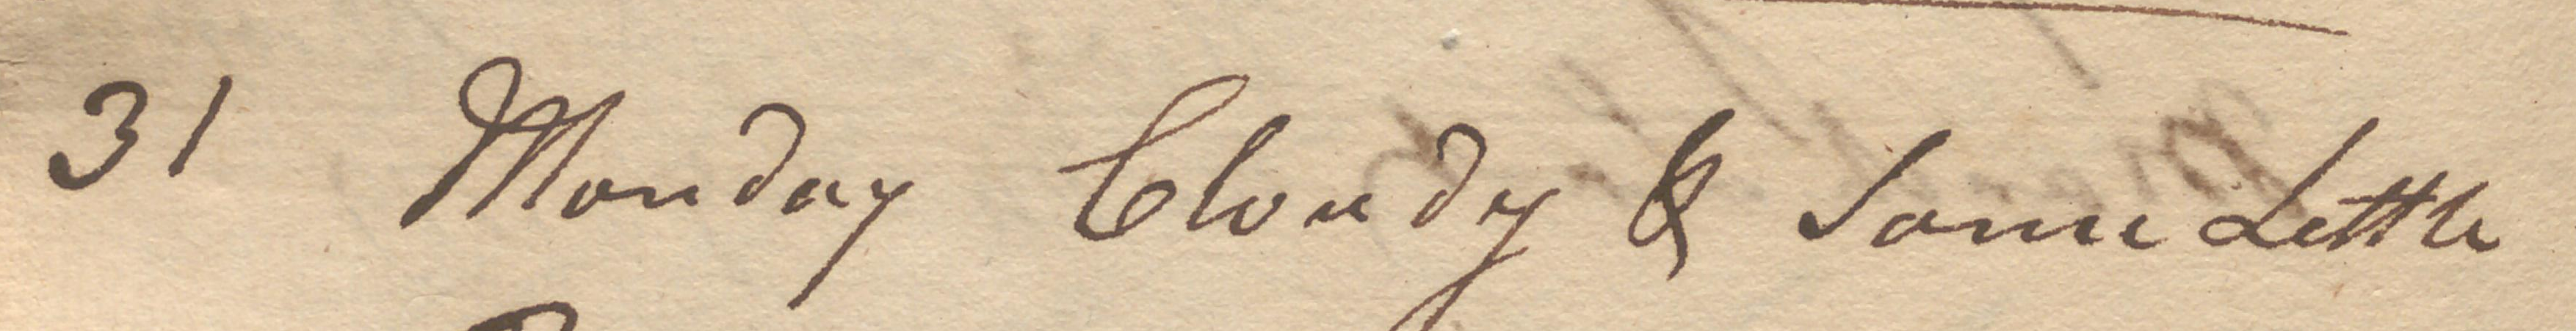31 Monday Cloudy & some Little
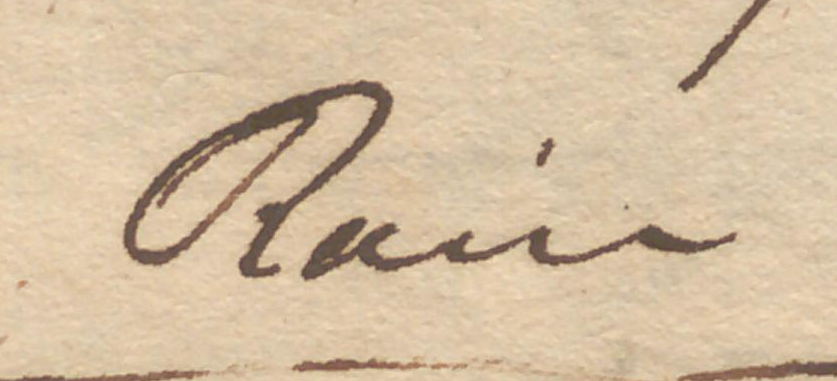Rain
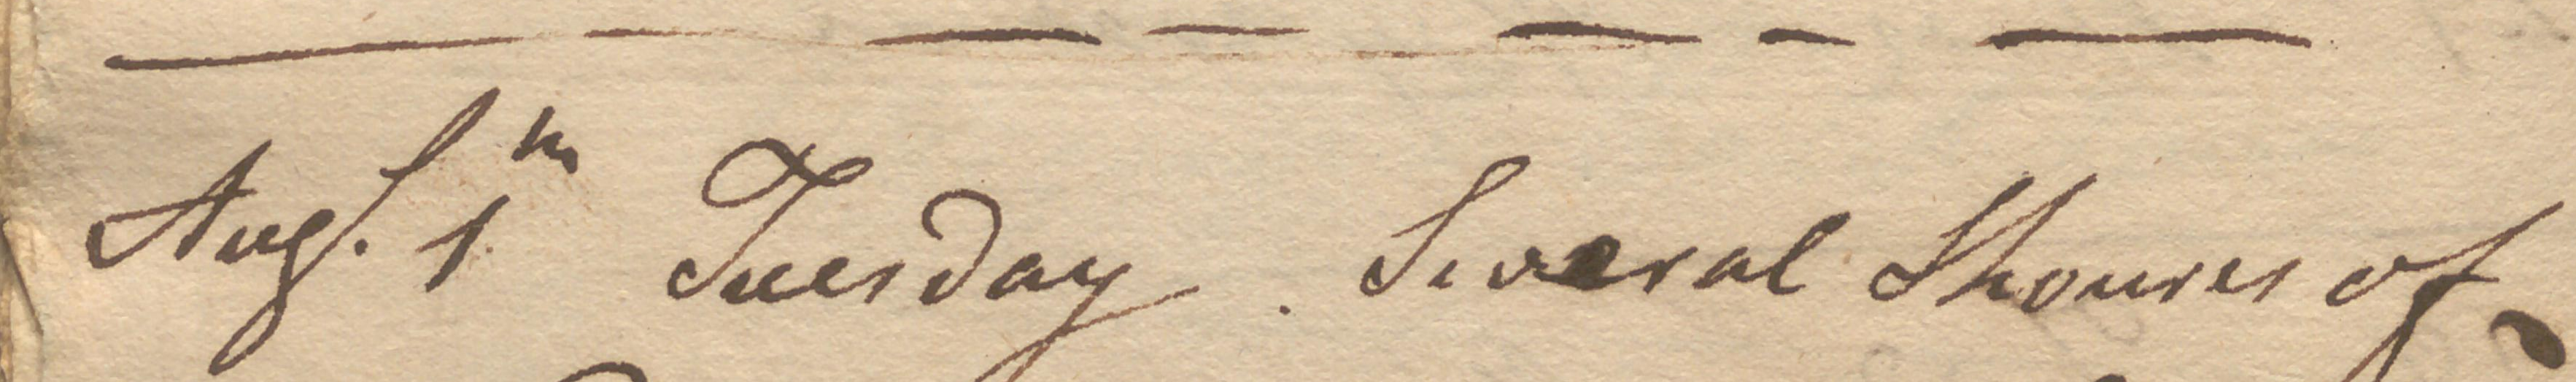Aug^t. 1^th Tuesday, Several shouses of
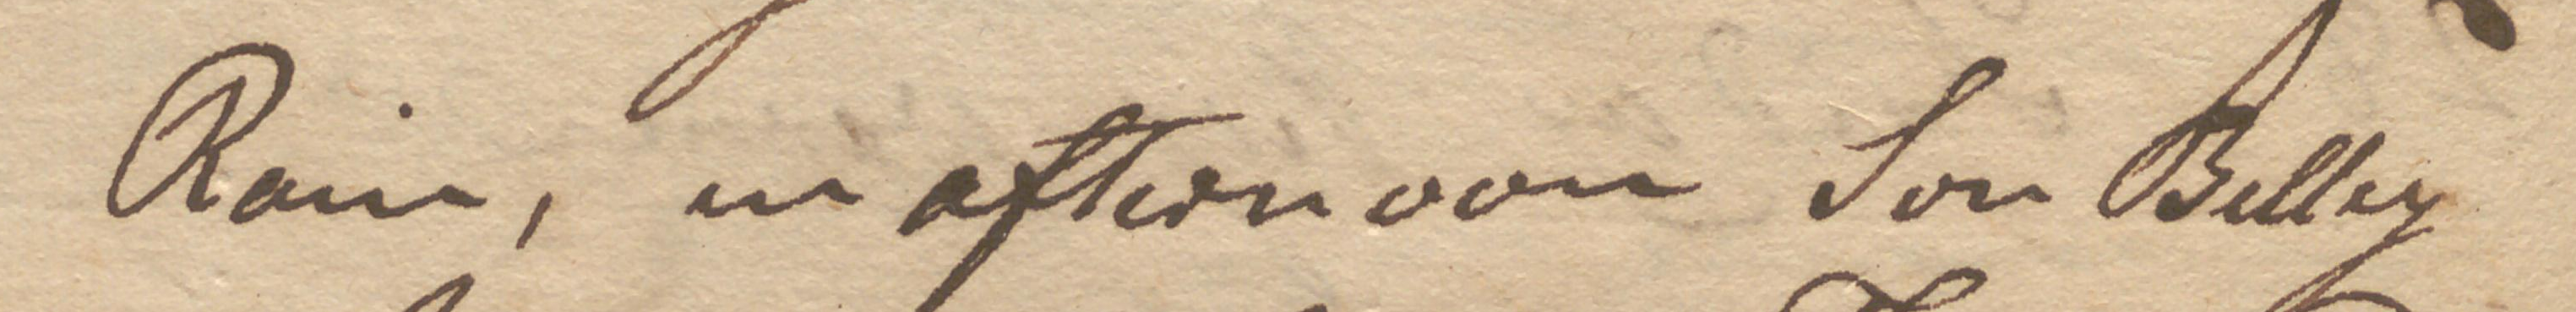Rain, in afternoon son Billey
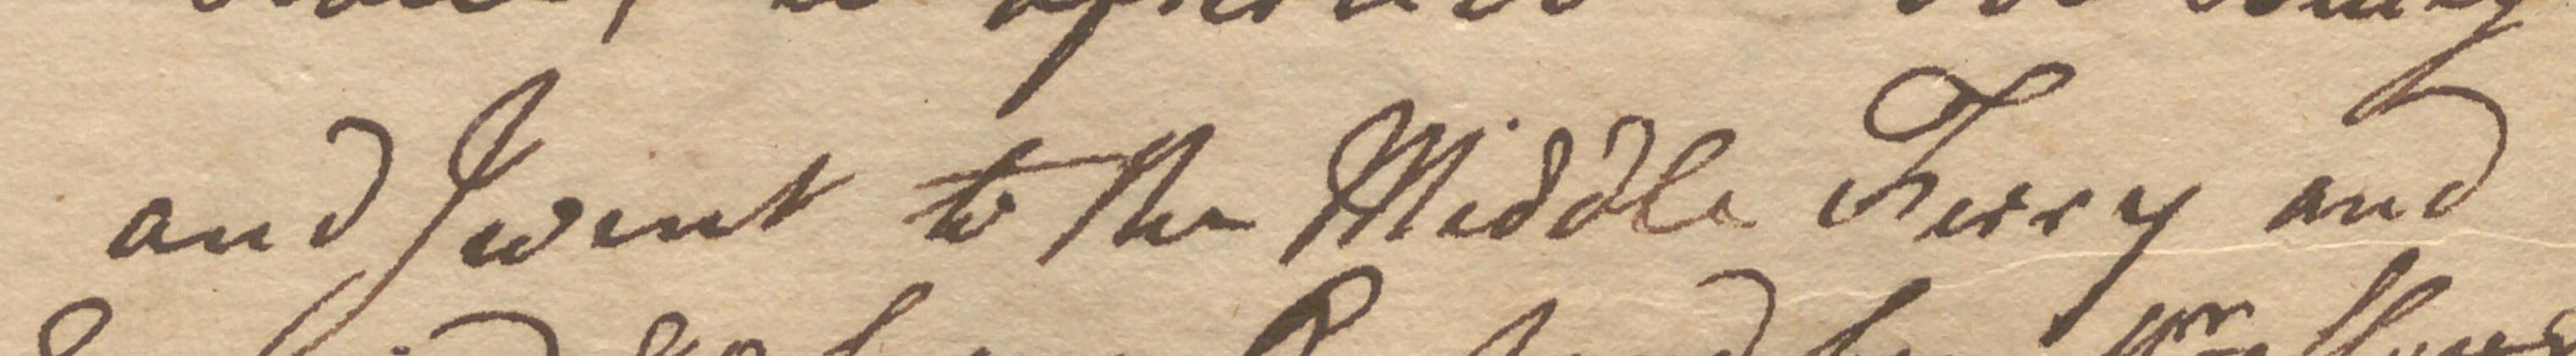and I went to the Middle Ferry and
